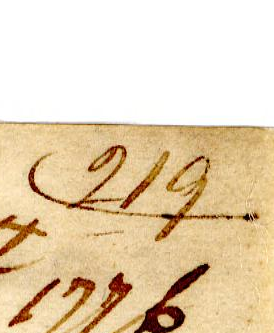219
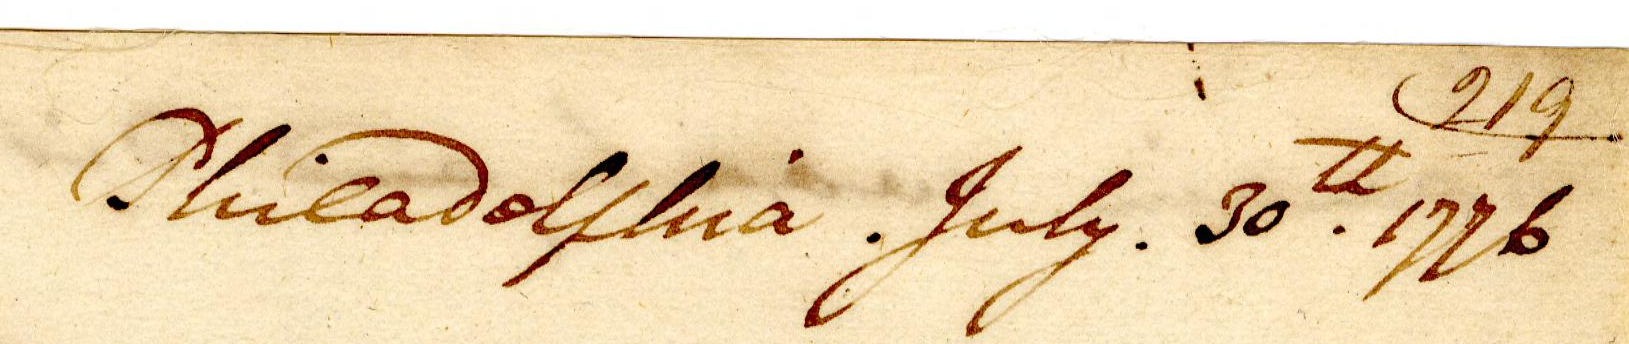Philadelphia. July. 30^th. 1776
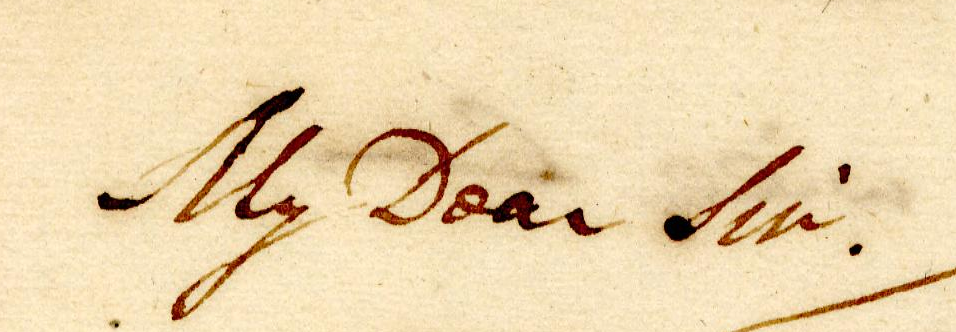My Dear Sir.
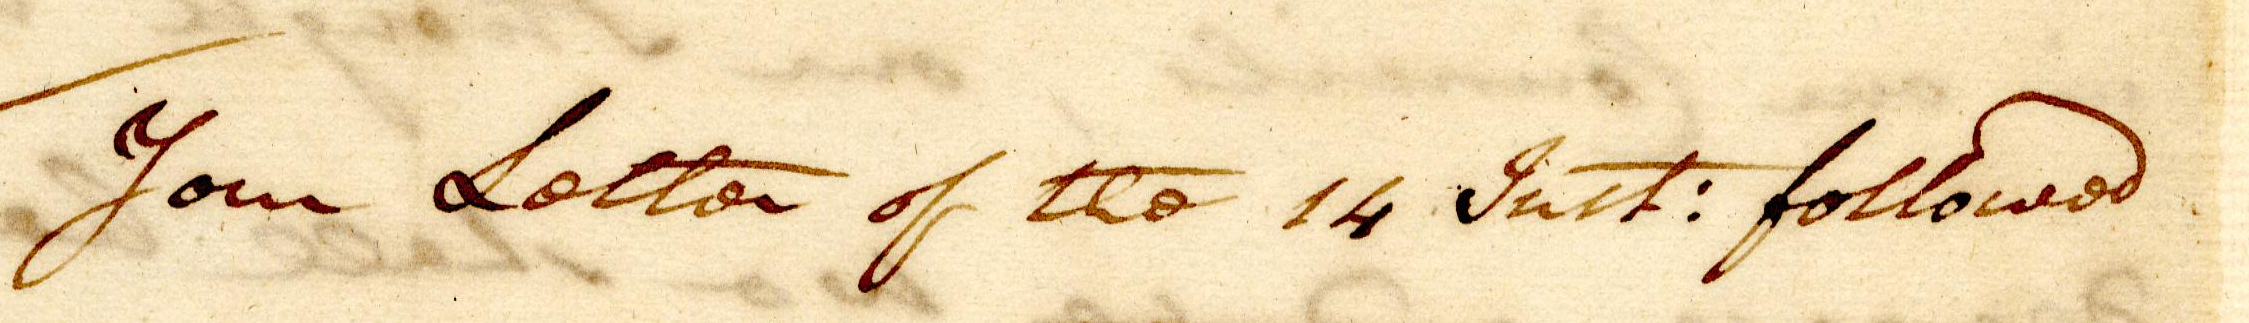Your Letter of the 14 Inst: followed
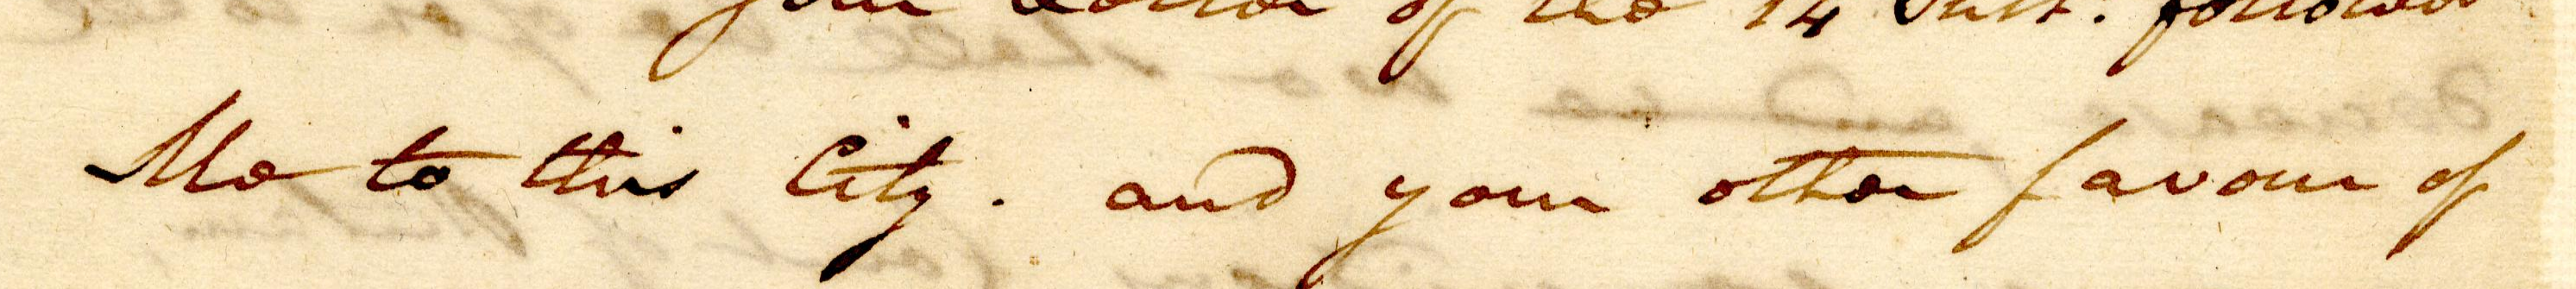Me to this City. and your other favour of
